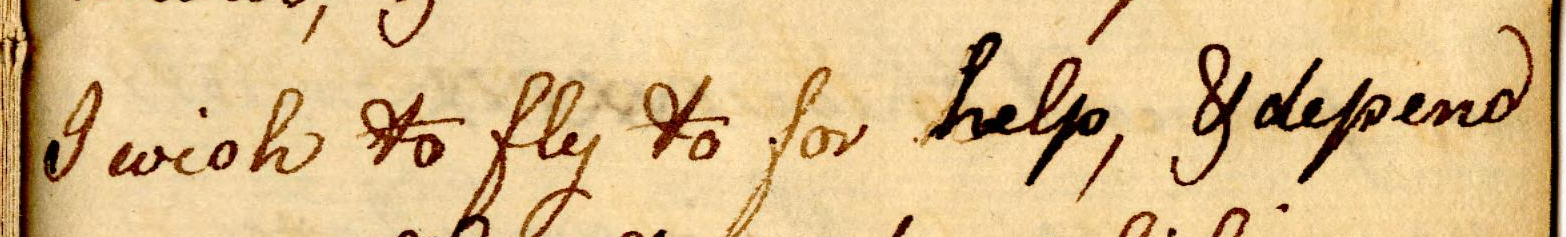I wish to fly to for help, & depend
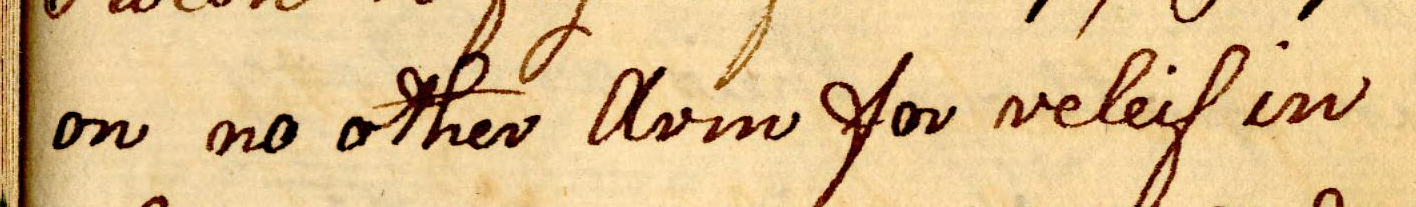on no other Arm for releif in
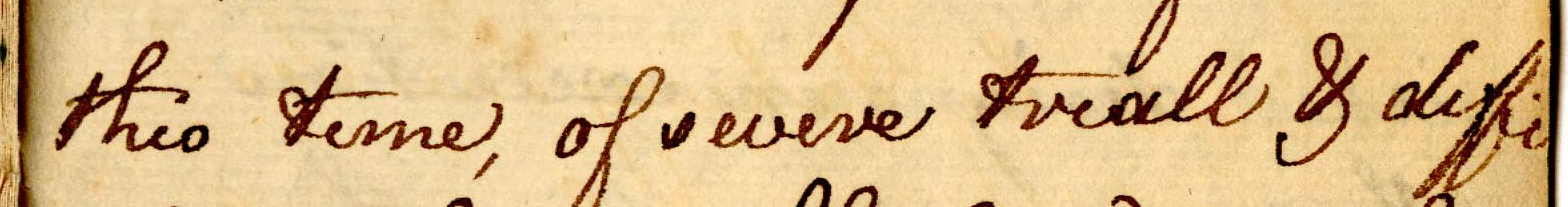this time, of severe triall & diffi
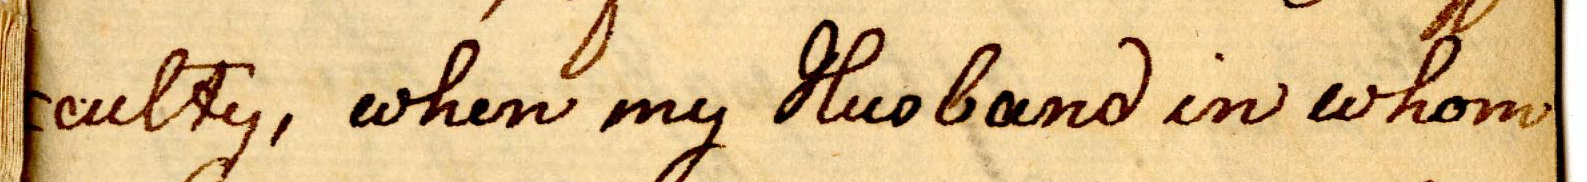-culty, when my Husband in whom
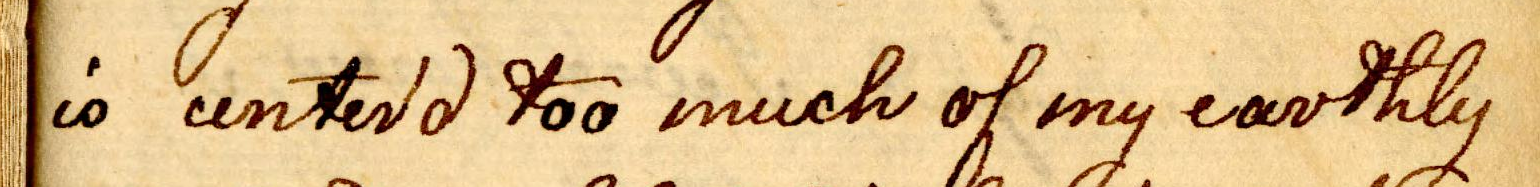is centr'd too much of my earthly
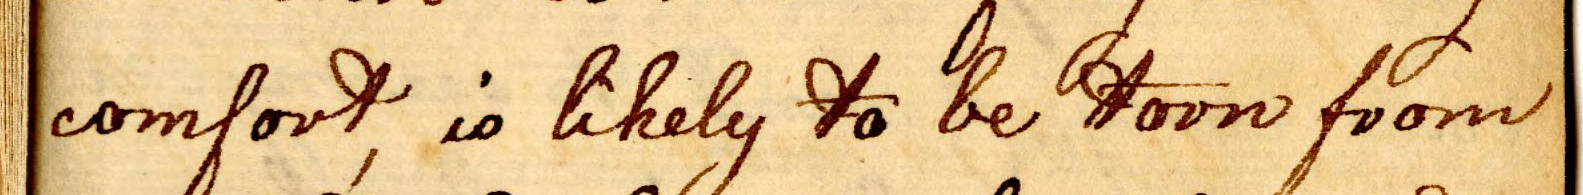comfort, is likely to be torn from
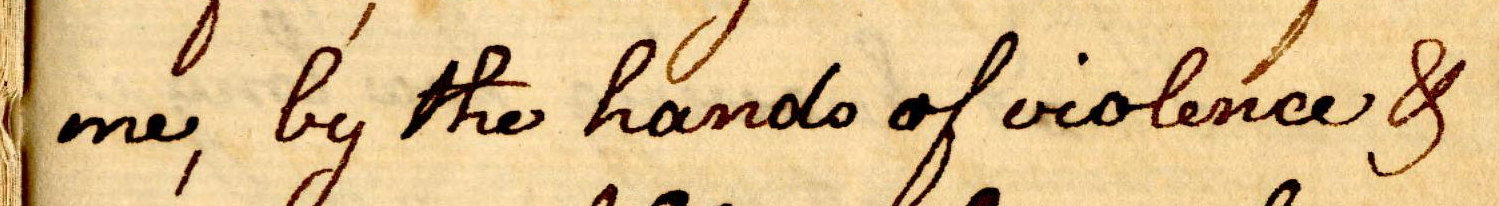me, by the hands of violence &
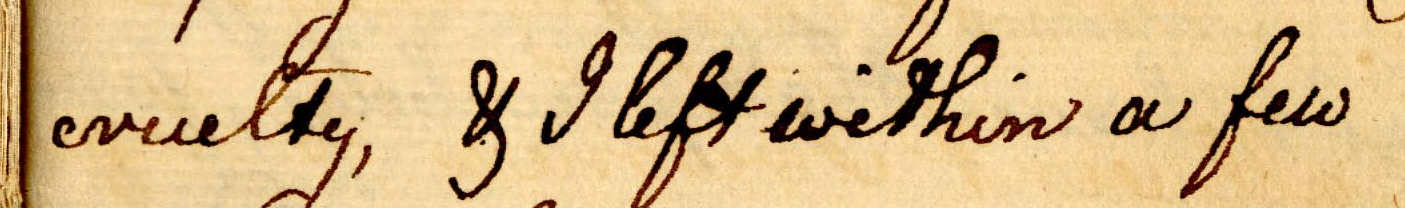cruelty, & I left within a few
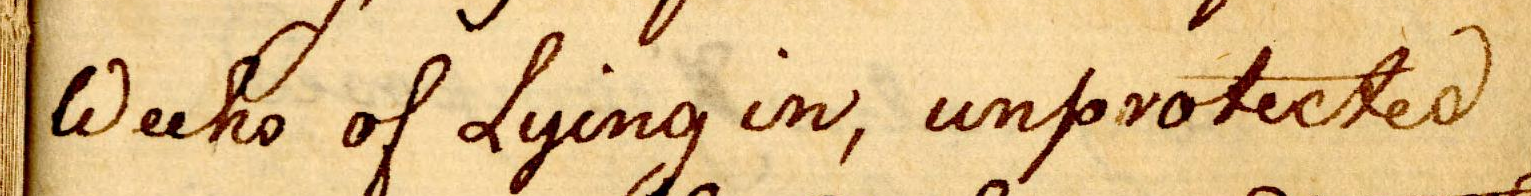Weeks of Lying in, unprotected
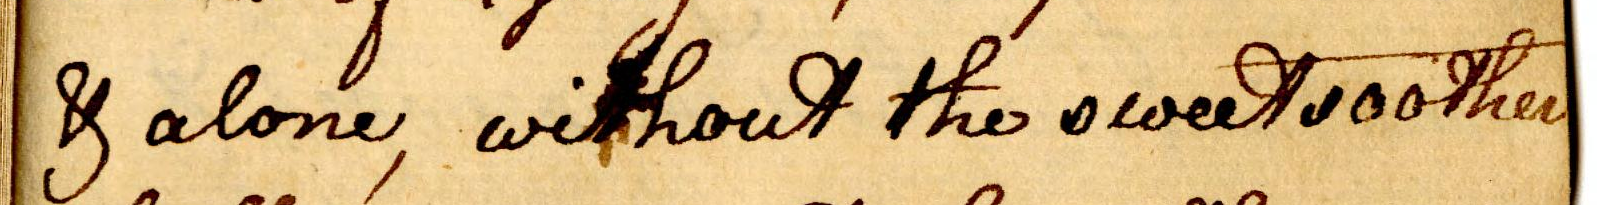& alone, without the sweet soother
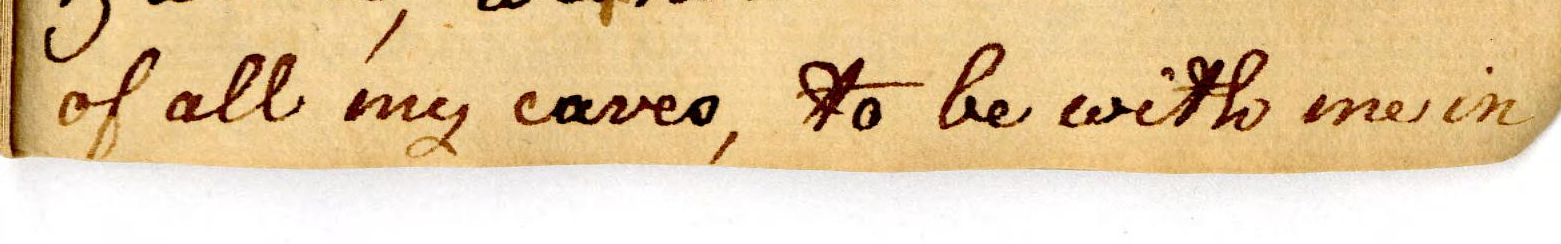of all my cares, to be with me in
